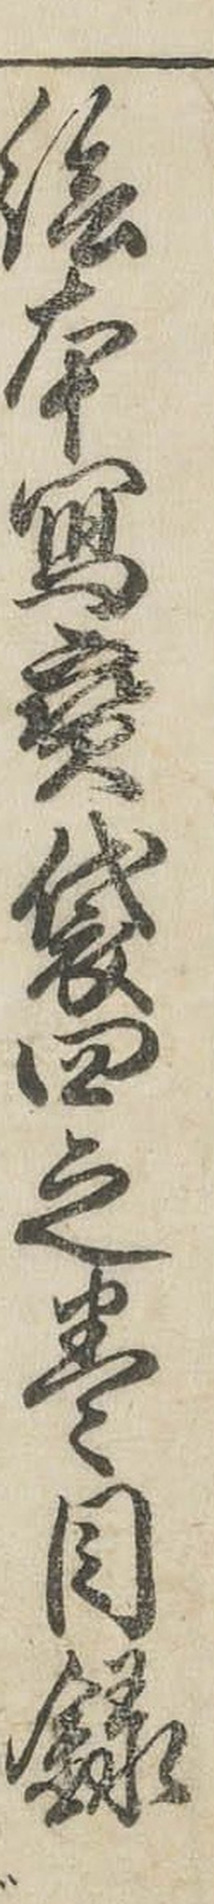絵本写宝袋四之巻目録

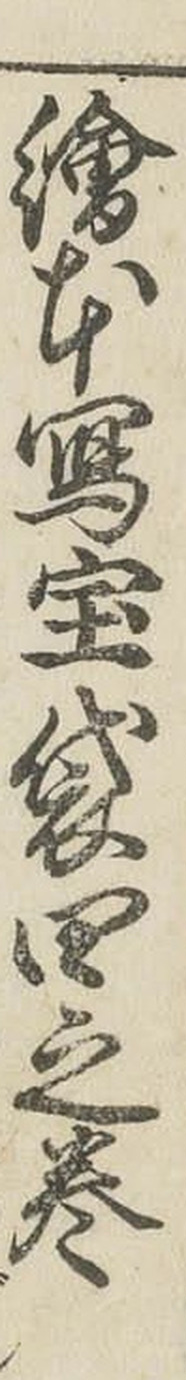絵本写宝袋四之巻
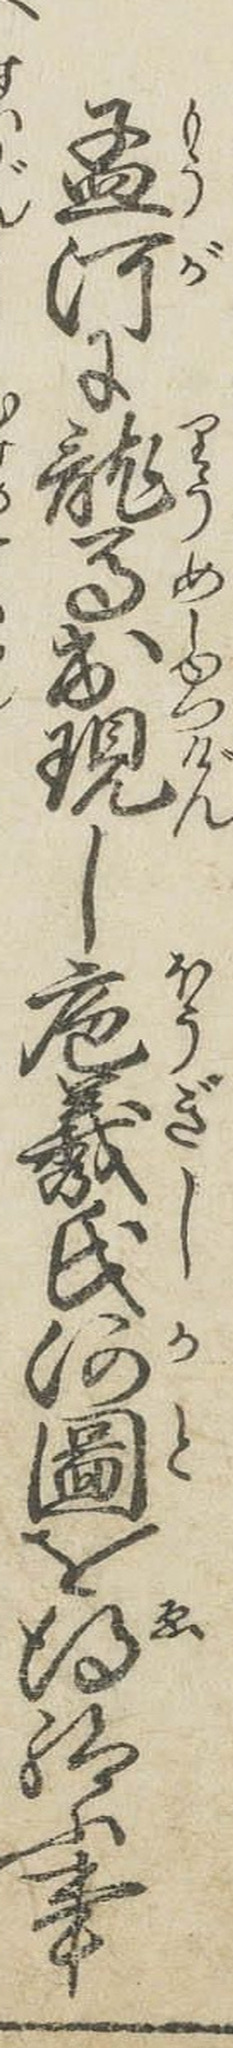孟河に竜馬出現し庖羲氏河図を得給ふ事
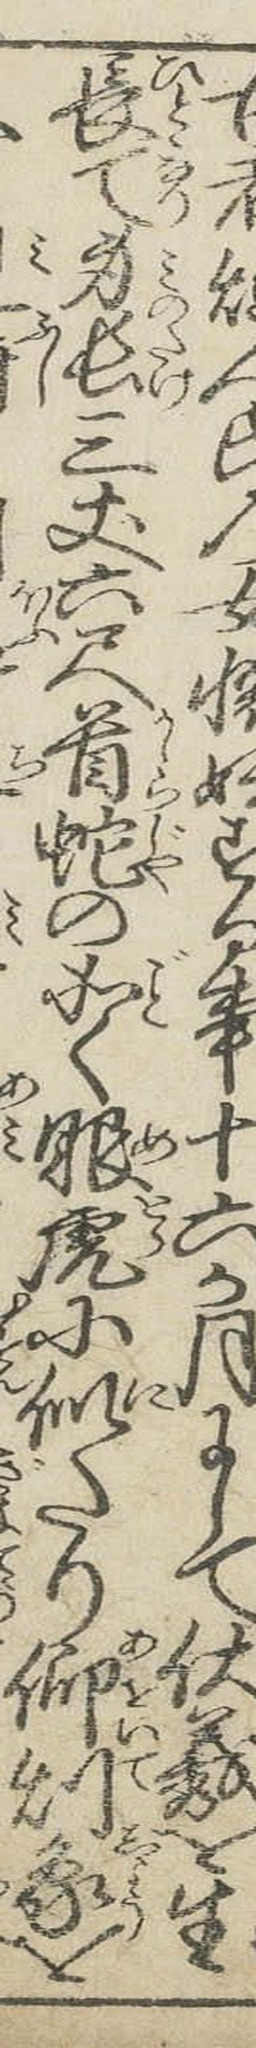長て身長三丈六尺首蛇の如く眼虎に似たり仰則象を
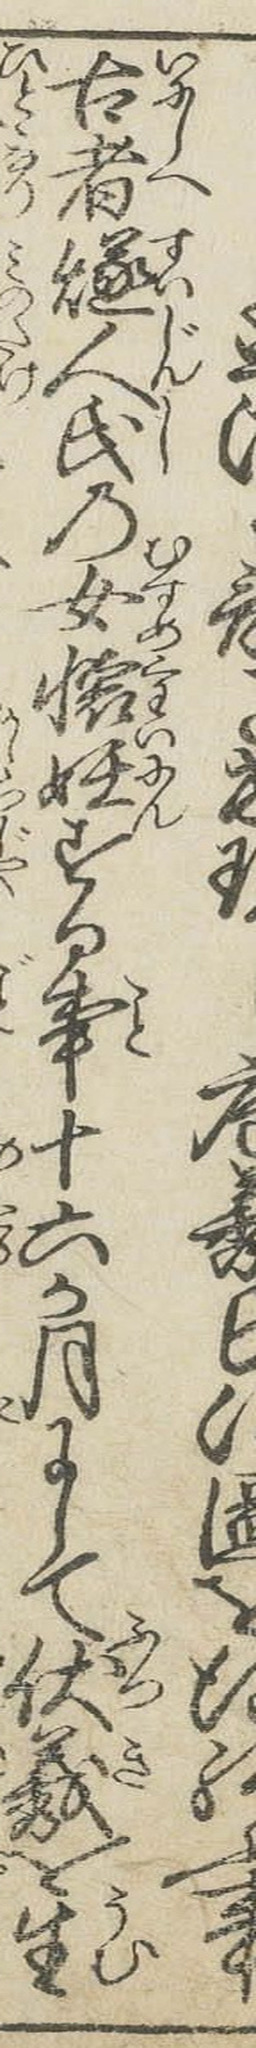古者燧人氏の女懐妊する事十六ゕ月にして伏羲を生
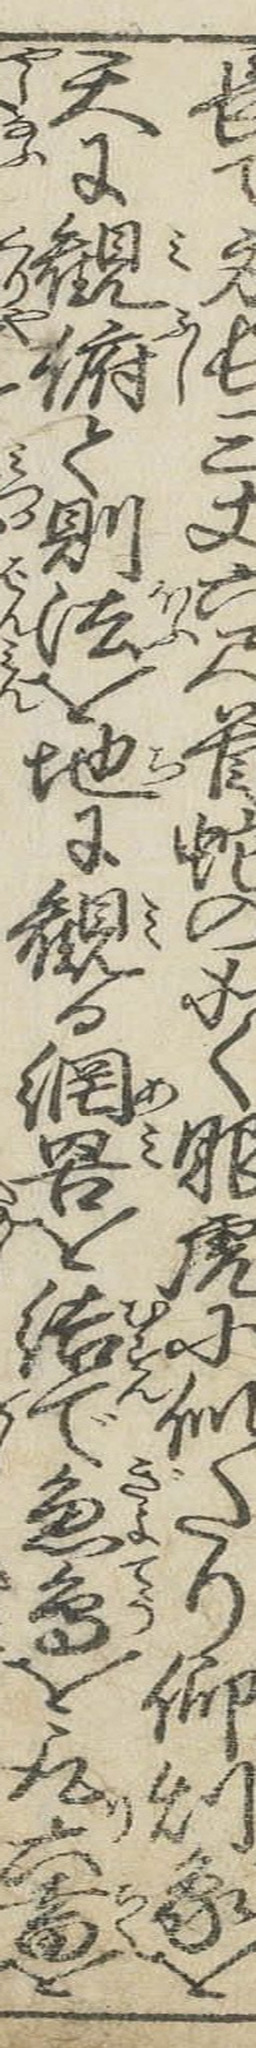天に観俯て則法を地に観る網罟を結で魚鳥を取り六畜を
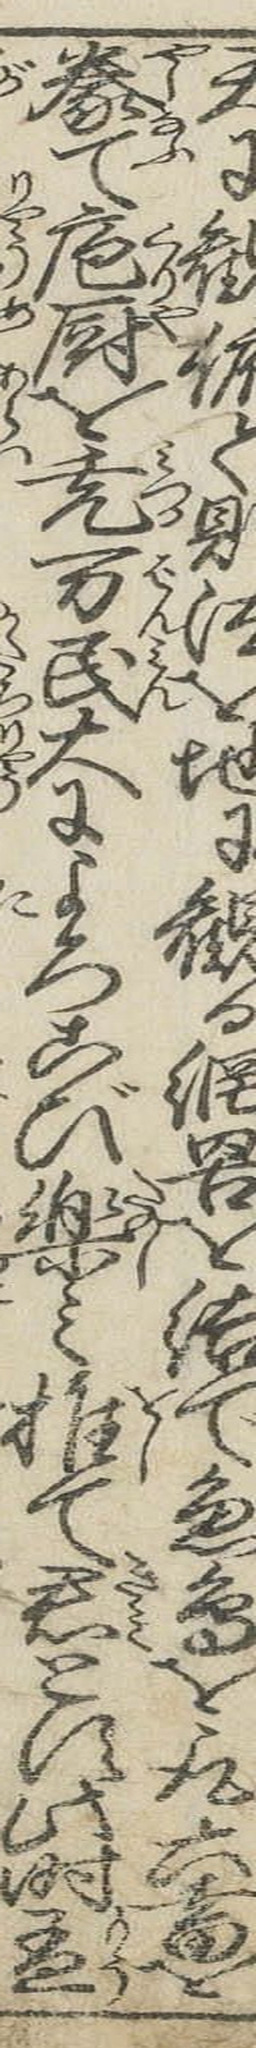豢て庖厨を充万民大によろこび楽み推て君とす此時孟
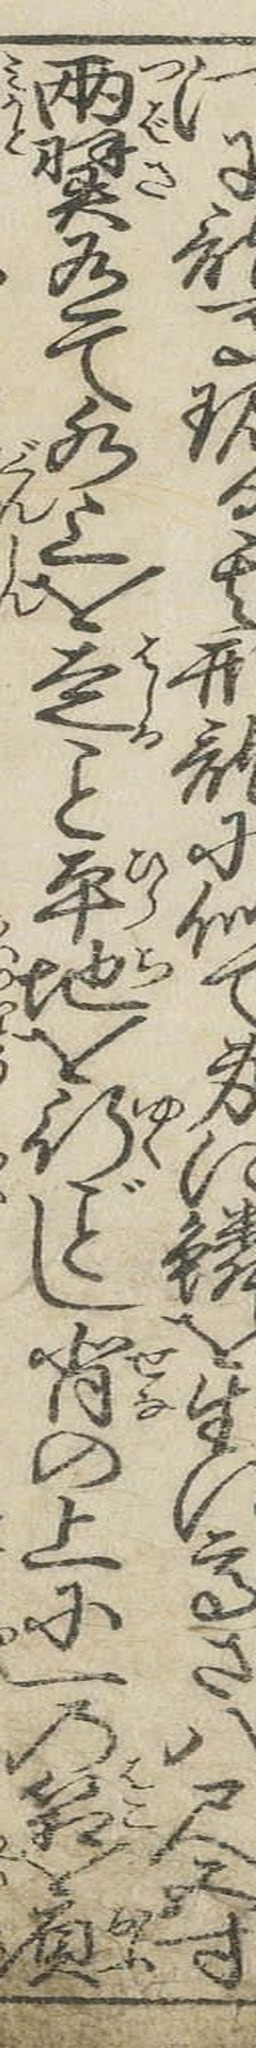両翼有て水上を走こと平地を行ごとし背の上に一の箱を負
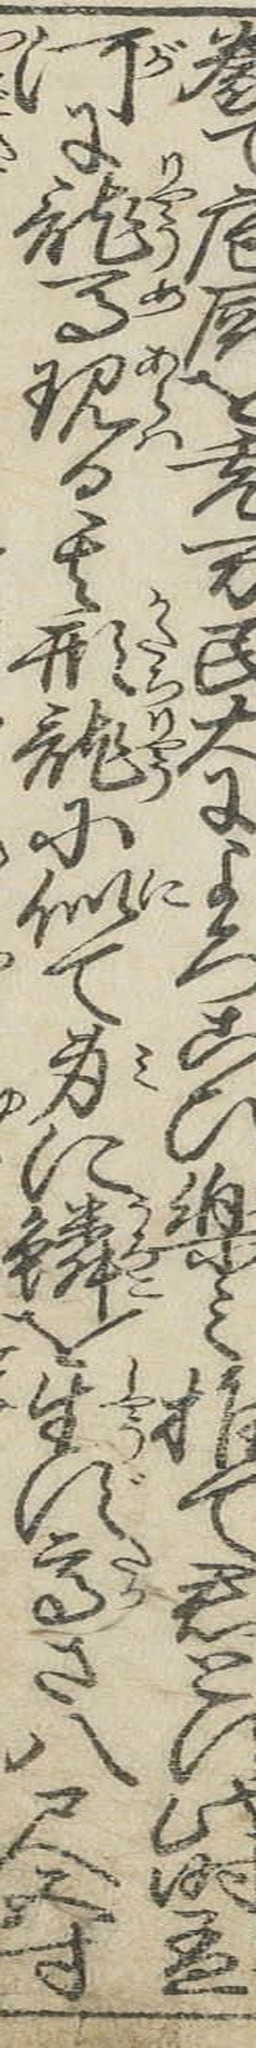河に竜馬現る其形竜に似て身に鱗を生ず高さ八尺五寸
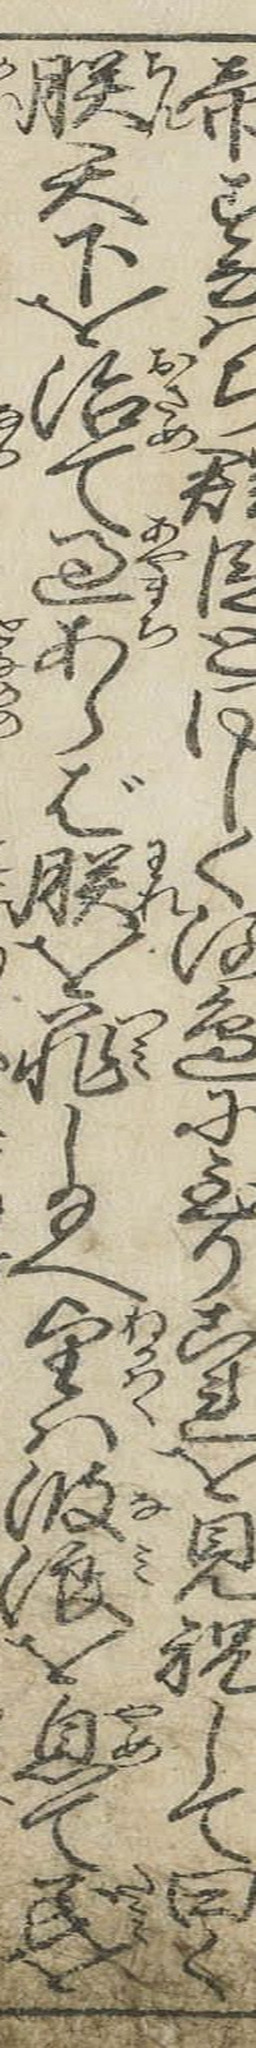朕天下を治て過あらば朕を罪し給へ望は波浪を息て民を
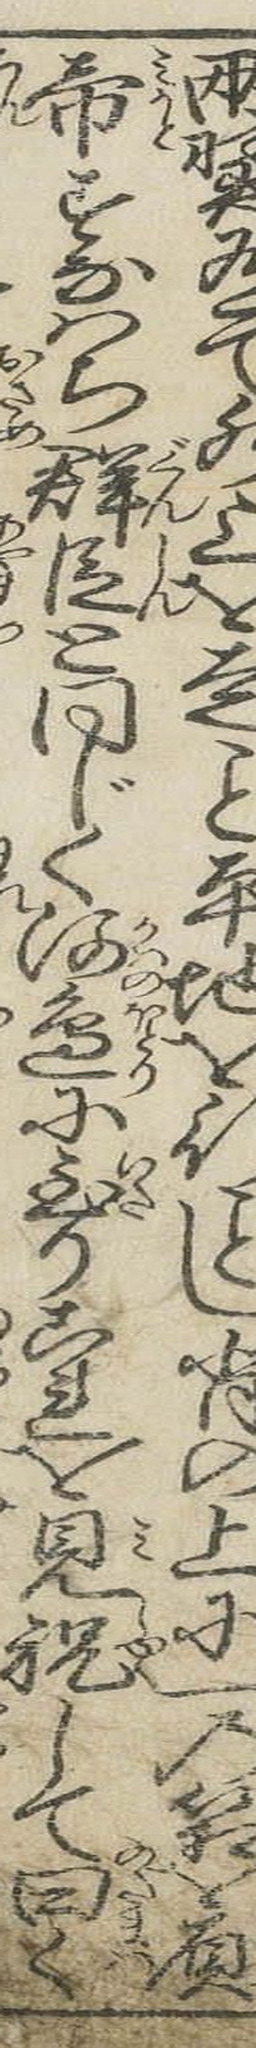帝すなはち群臣と同じく河辺に至りこれを見祝して曰く
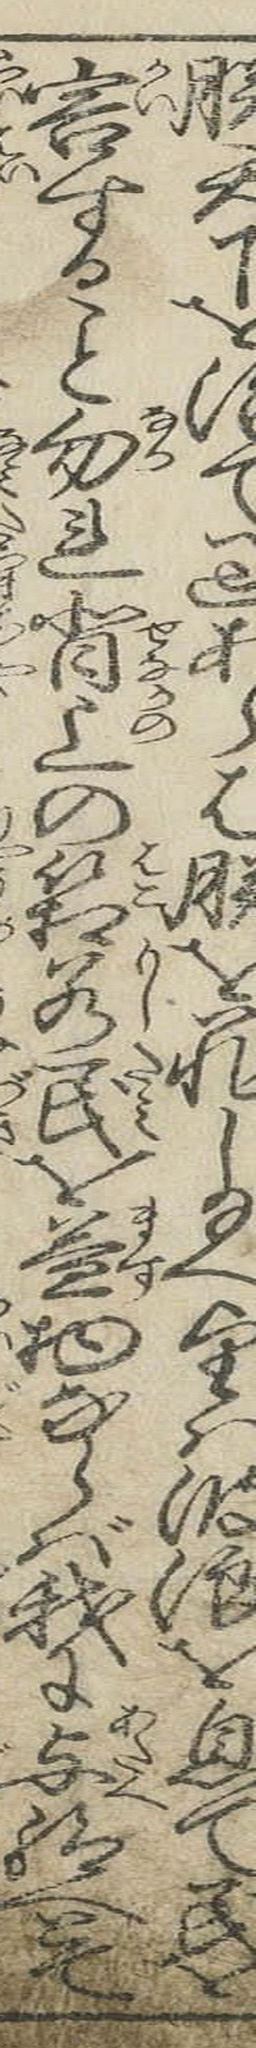害すること勿れ背上の箱若民を益物ならば我に与給へとて
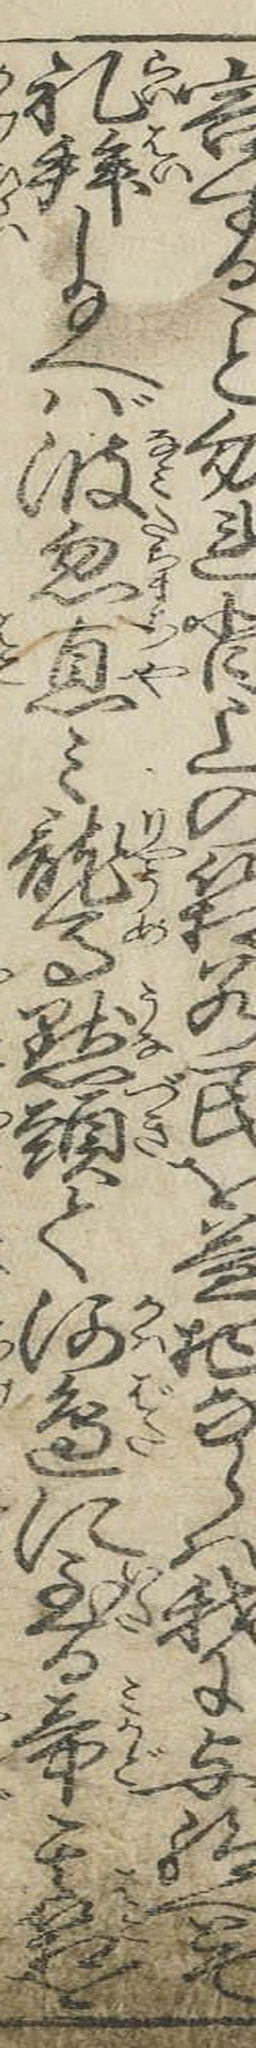礼拝し給へば波忽息み竜馬黙頭て河辺に至る帝其箱を
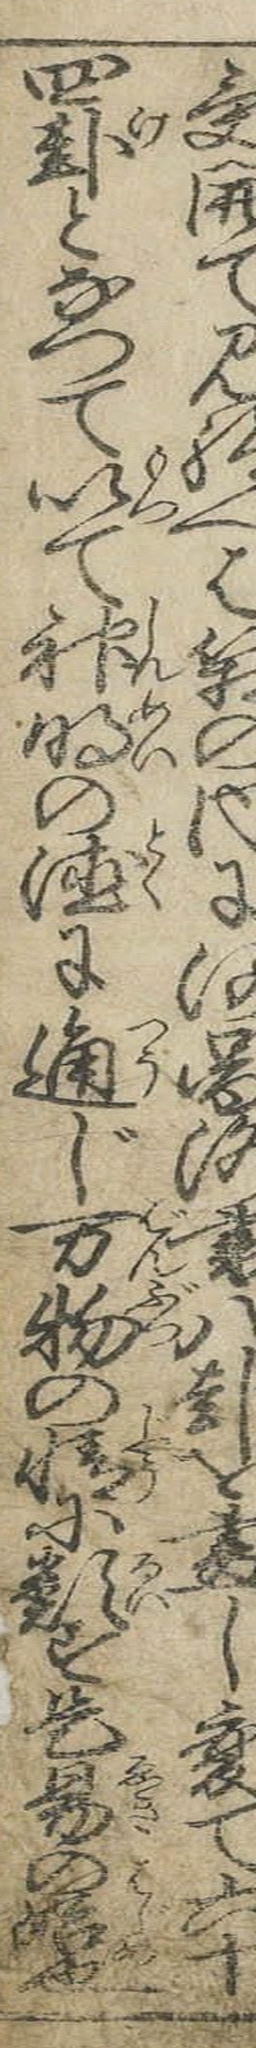四卦となつて以て神明の徳に通じ万物の情に類す是易の始也
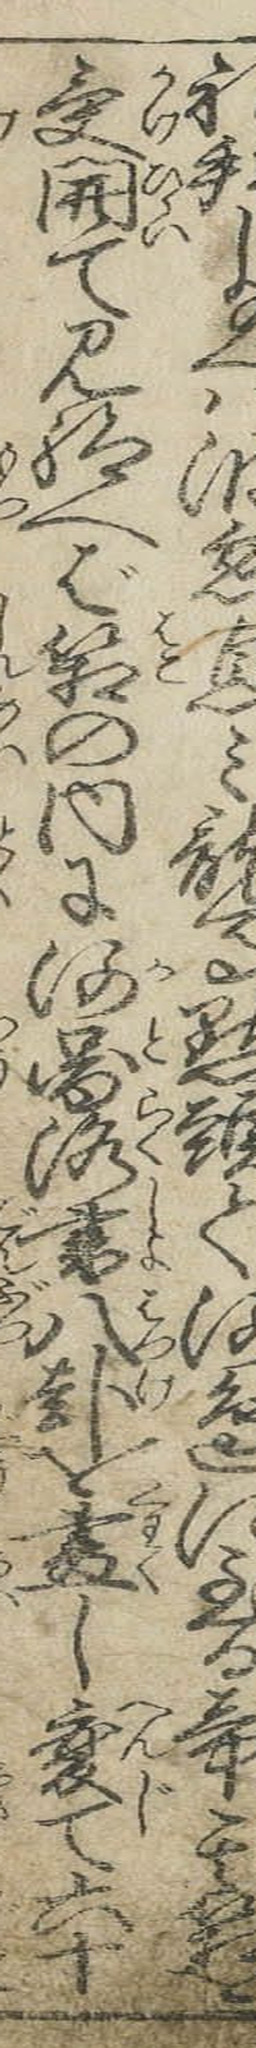受開て見給へば箱の内に河図洛書八卦を画し変て六十

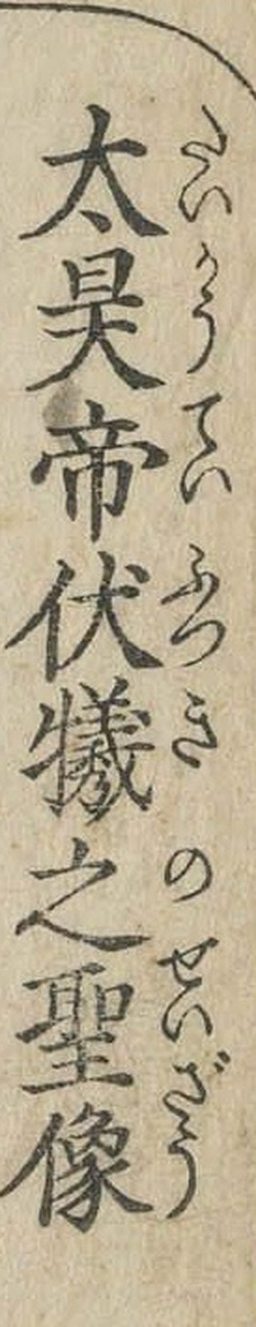太昊帝伏犧之聖像
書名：絵本写宝袋 9巻 4之巻
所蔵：東京学芸大学教育コンテンツアーカイブ
